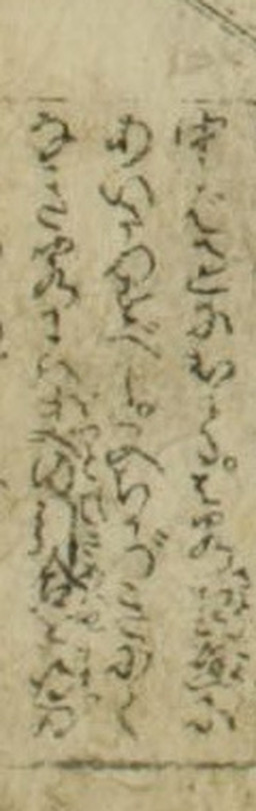あいさつすべし。又ちかづきにて
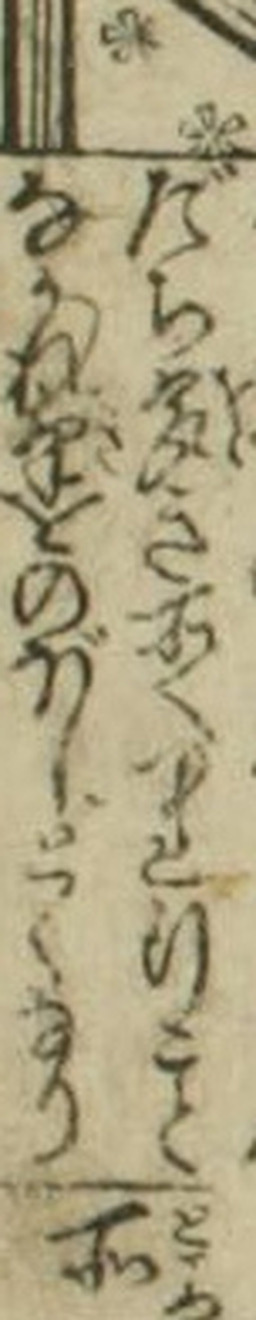なかれ気をのぼし。どくなり
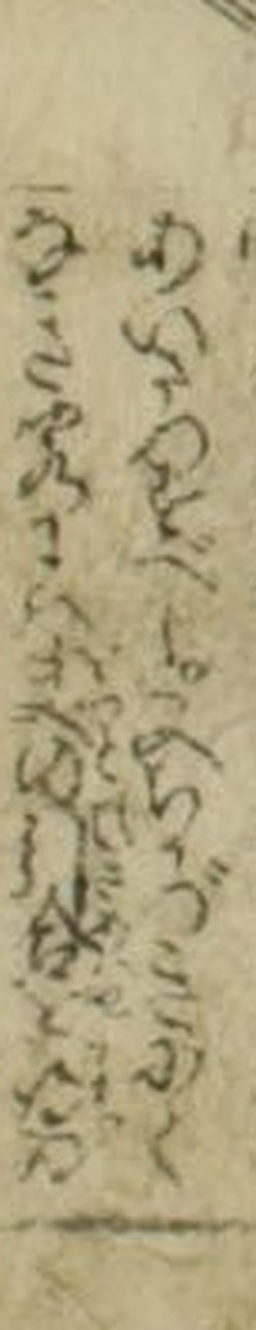なき客には夫の引合を待ゐ
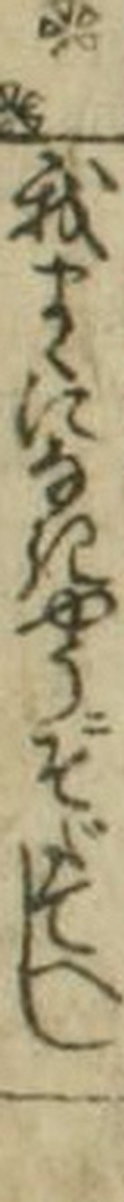我まゝになきやう二そだてへし
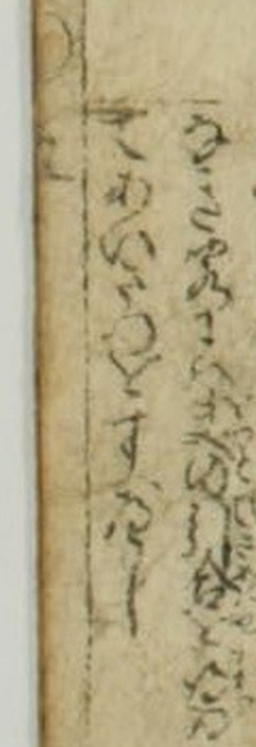てあいさつをすべし

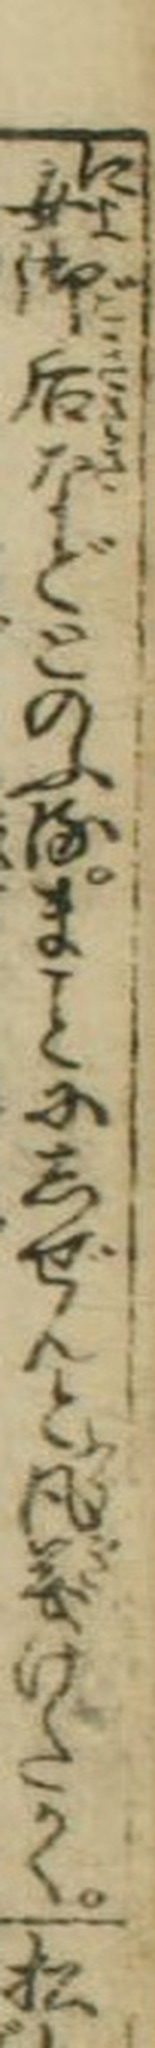女御后などとのふる。まことにしぜんと風義けだかく。
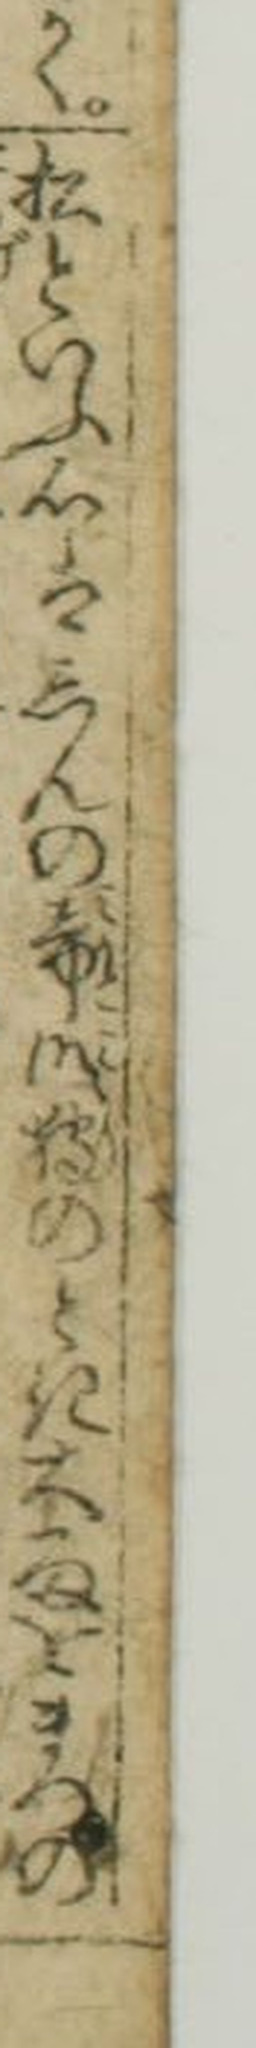松といふ名はしんの帝御狩のとき大まをまつの
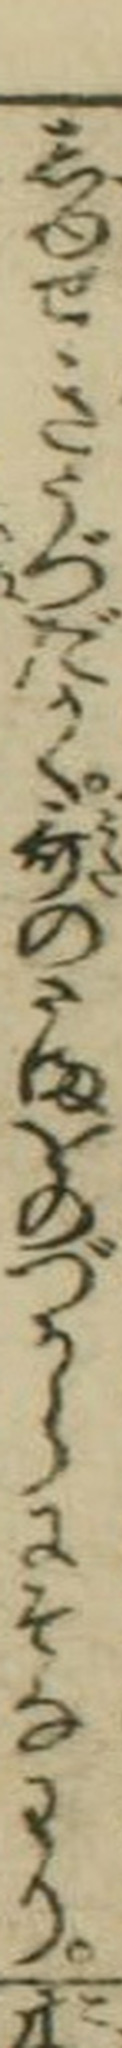しゆせきうづだかく。哥のさまをのづからにそなわり。
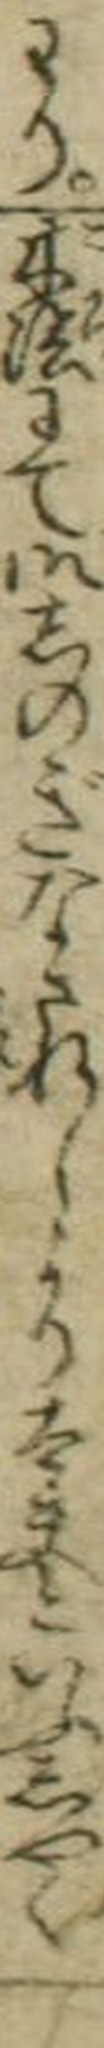木陰にて御しのぎなされしより太夫といふしやく
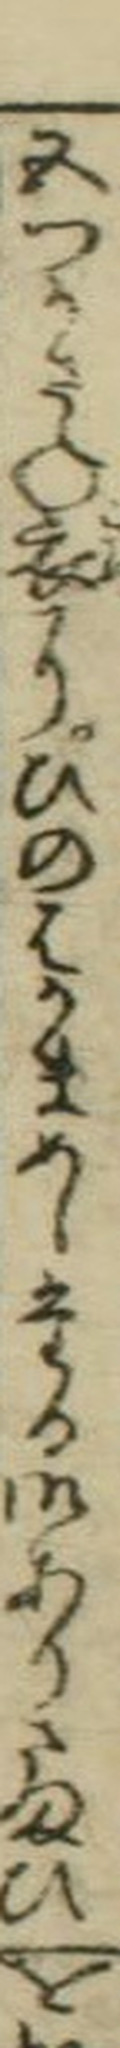五つかさね衣に。ひのはかまめしたる御ありさまひ
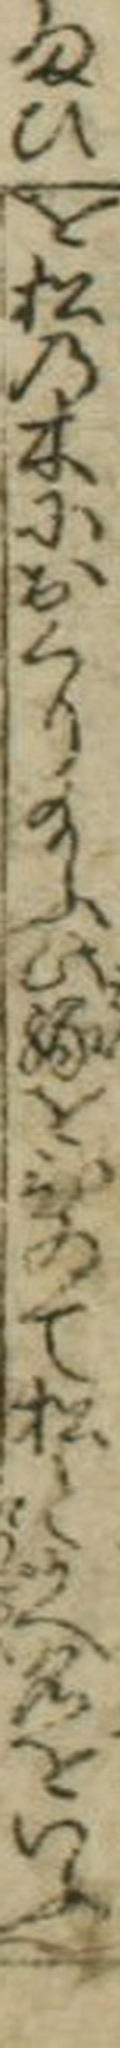を松の木におくり給ふ此縁をひゐて松とかへ名をいふ
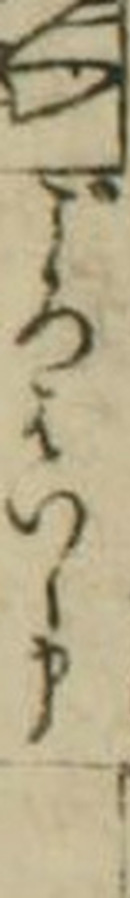ころはいゝ申
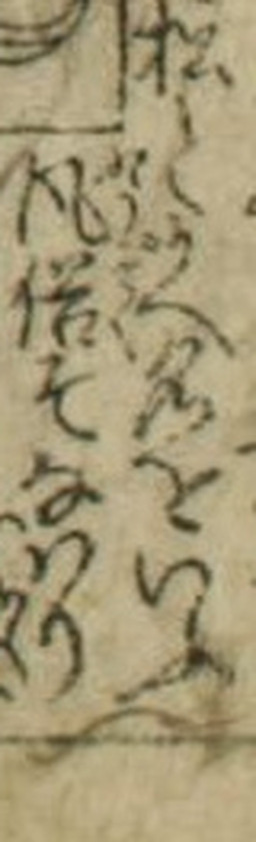風俗そなはり
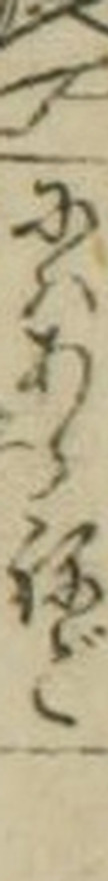にはあらねど
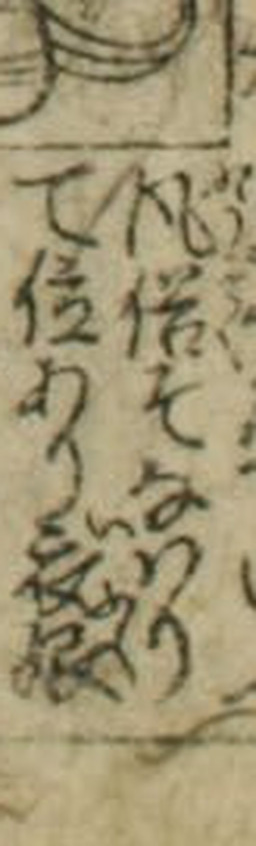て位あり衣服
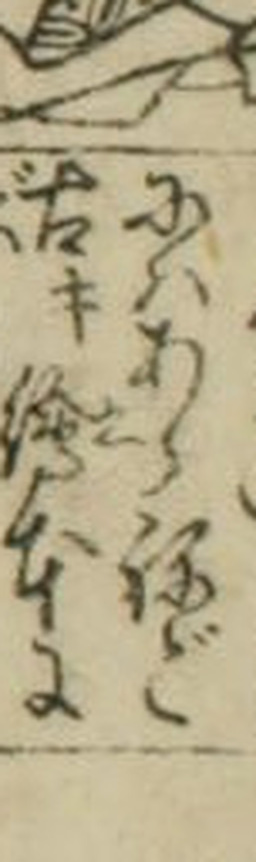古き繪本に
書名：女源氏教訓鑑
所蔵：東京学芸大学附属図書館
